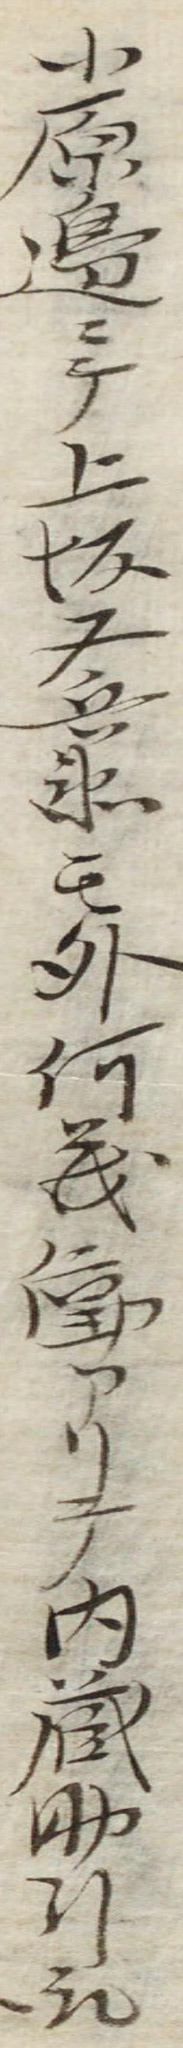小原迠上坂又兵衛其外何も働アリテ内蔵助引取
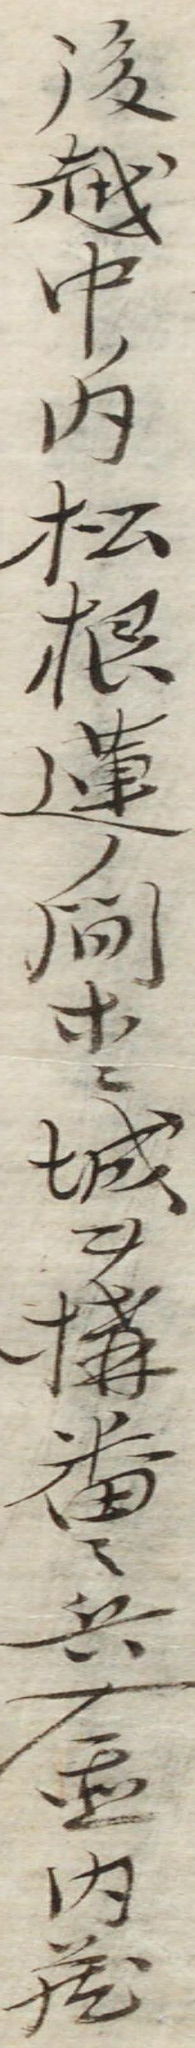後越中内松根蓮ノ間等城構番之兵入置内蔵
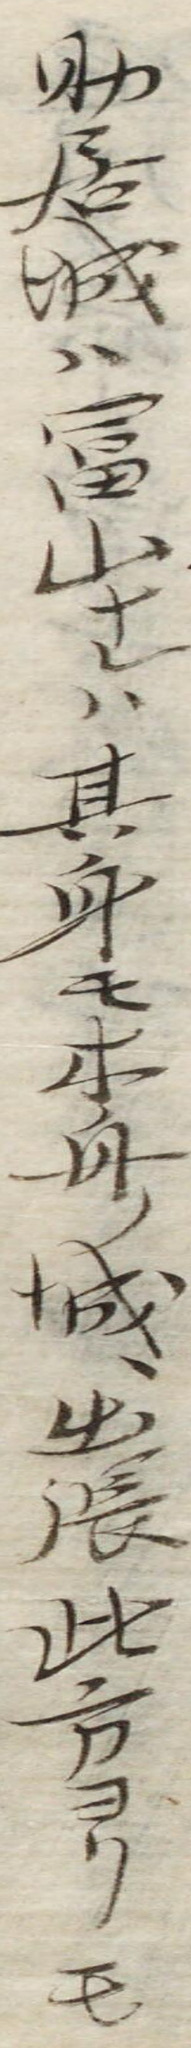助居城ハ富山其身木舟城へ出張此方
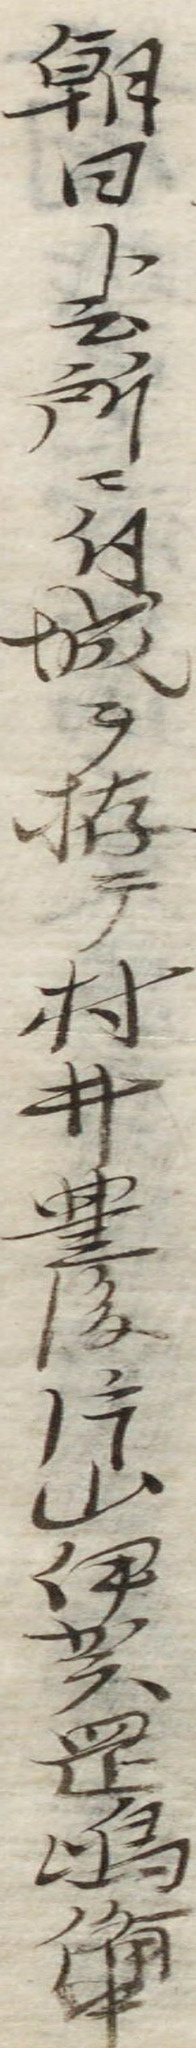朝日云所付城拵村井豊後片山伊賀岡嶋備中
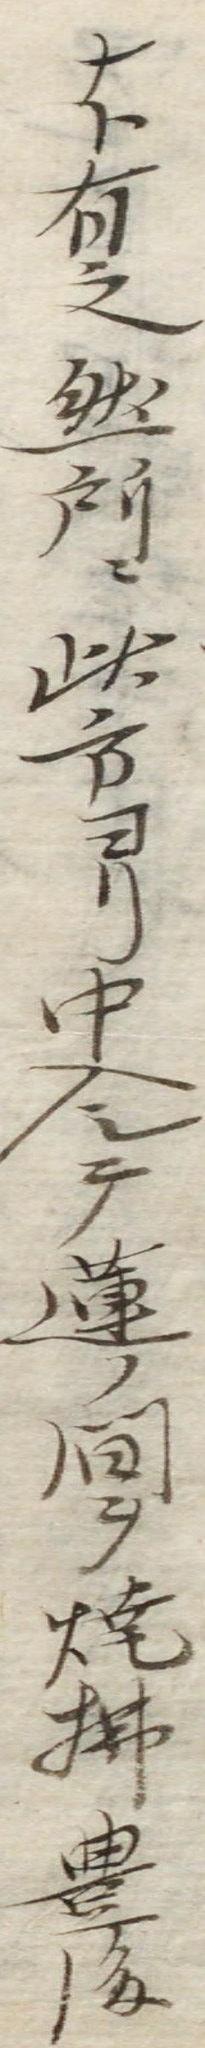ナト有之然所此方中入蓮間焼拂豊後
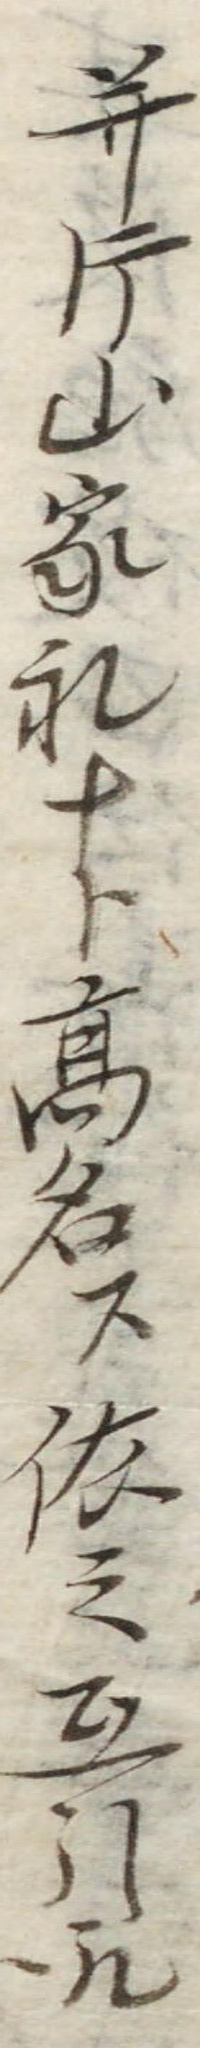并片山家礼ナト高名仍之互引取
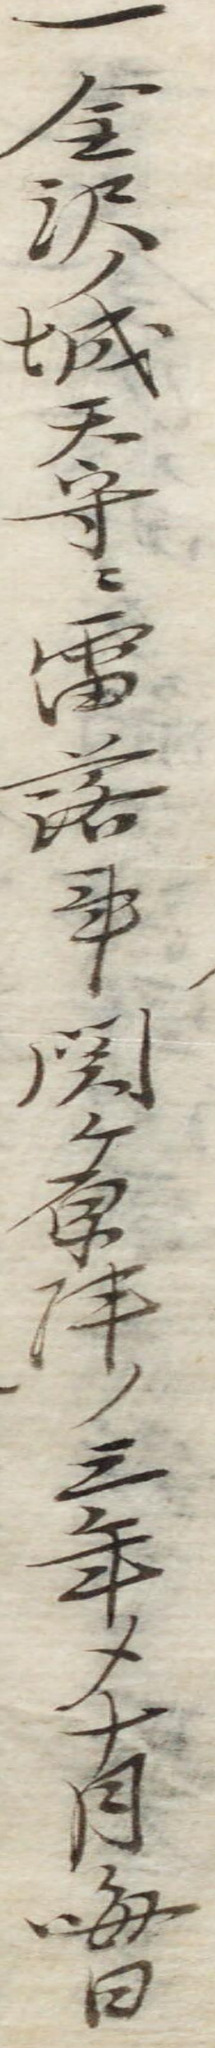一金沢城天守雷落事関ヶ原陣三年メ十月晦日
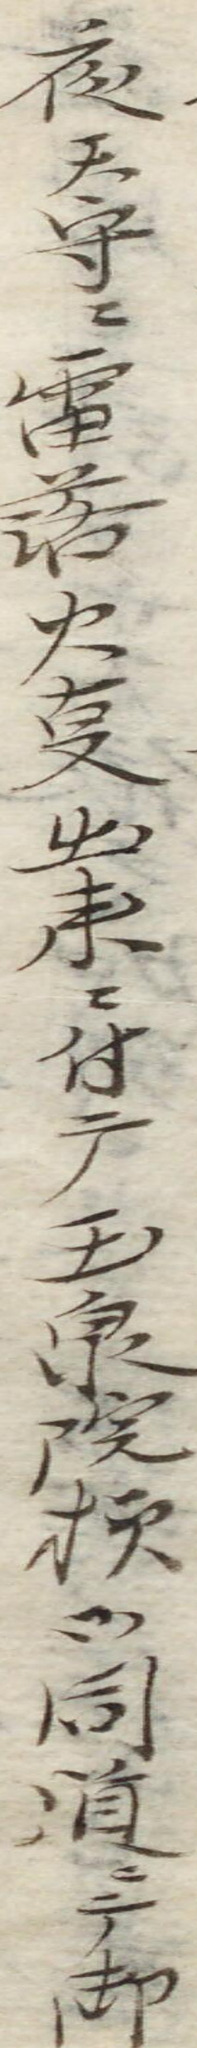夜天守落雷火事出来付テ玉泉院様御同道御
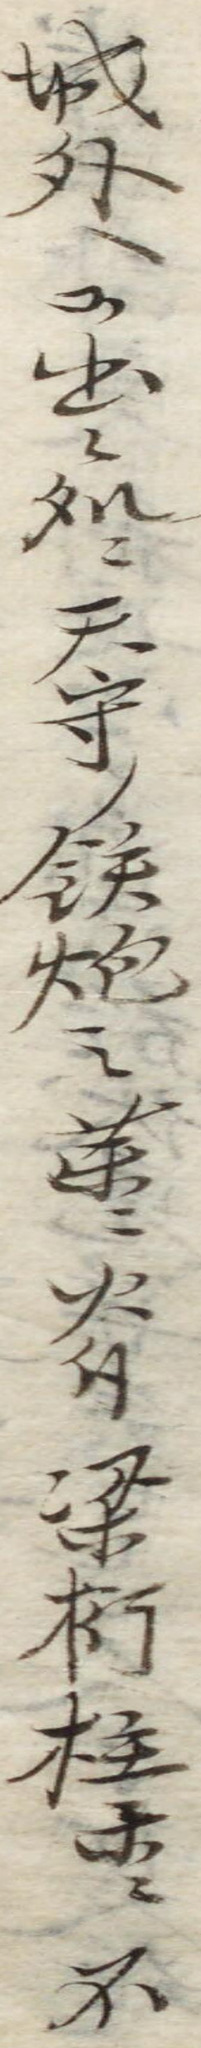城外へ御出候処天守鉄砲之薬火付梁桁柱等不
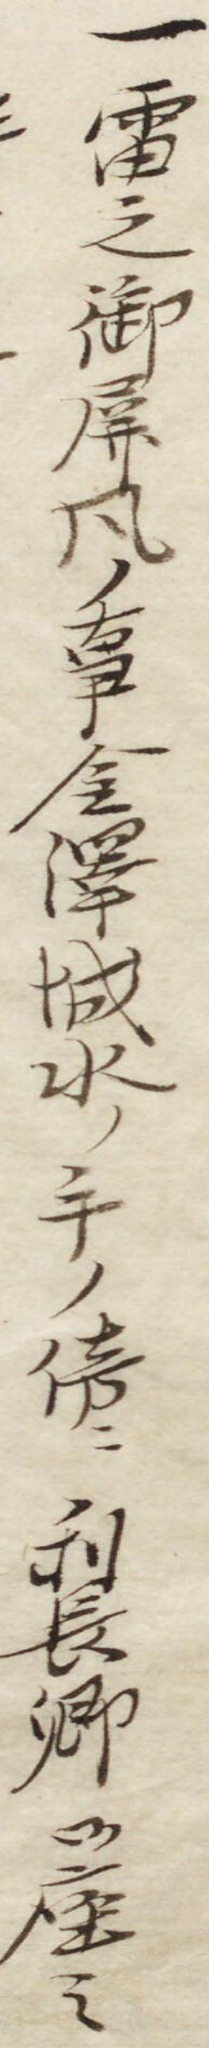一雷之御屏風ノ事金澤城水手ノ傍利長卿御座之
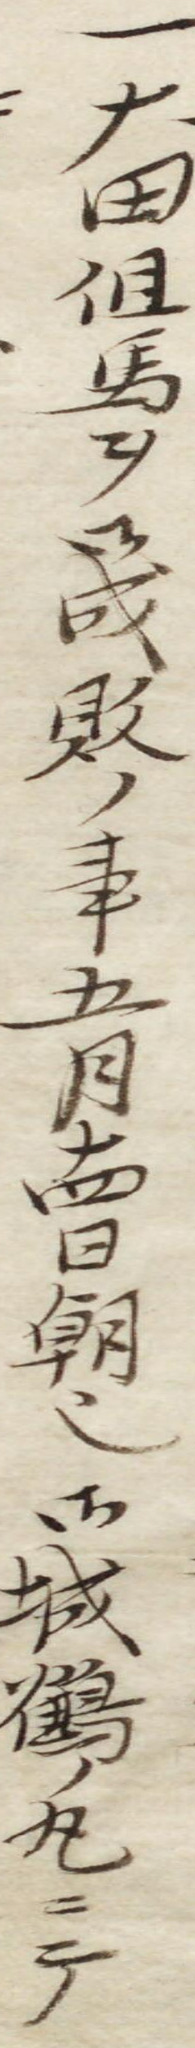一大田但馬ヲ御成敗事五月十四日朝也御城鶴ノ丸
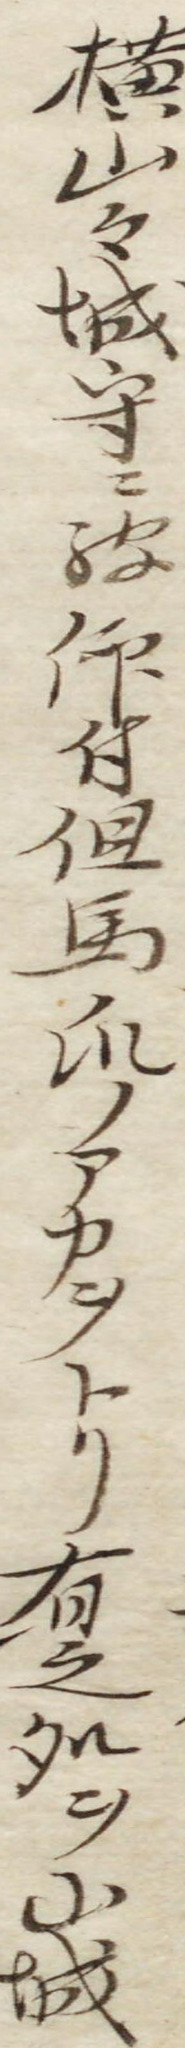横山々城守被仰付但馬爪ノアカヲトリ有之処ヲ山城
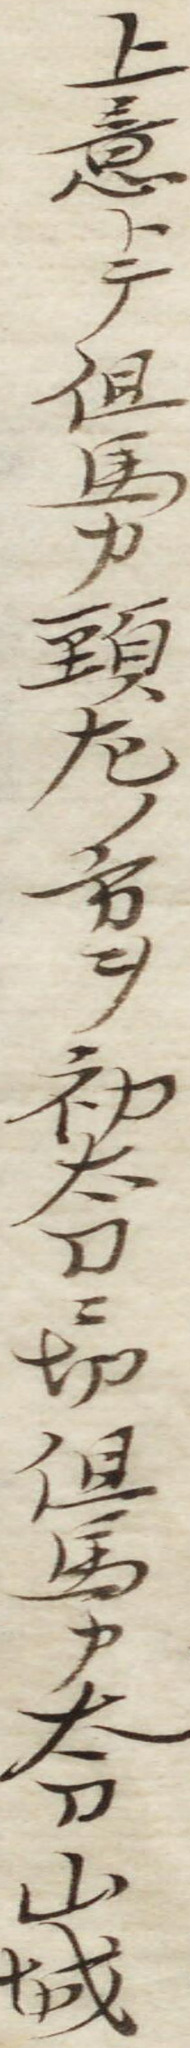上意トテ但馬カ頭左ノ方ヲ初太刀切但馬カ太刀山城
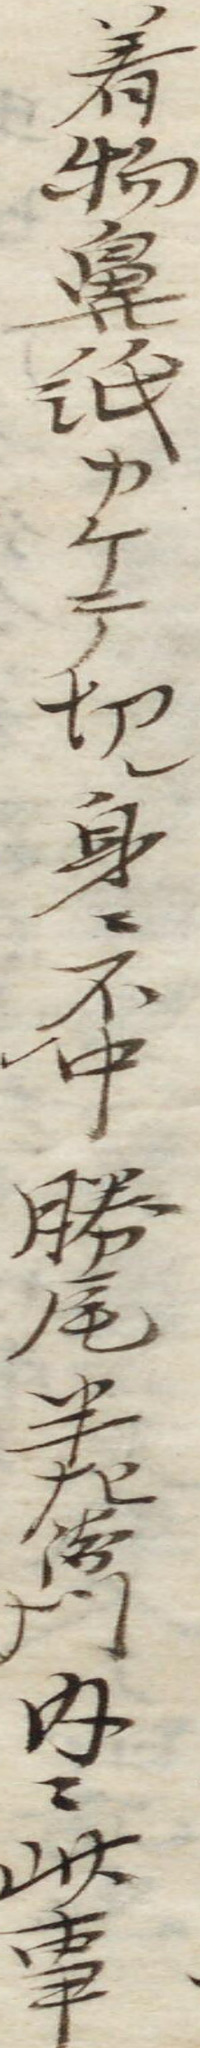着物鼻紙カケテ切身不中勝尾半左衛門内此事
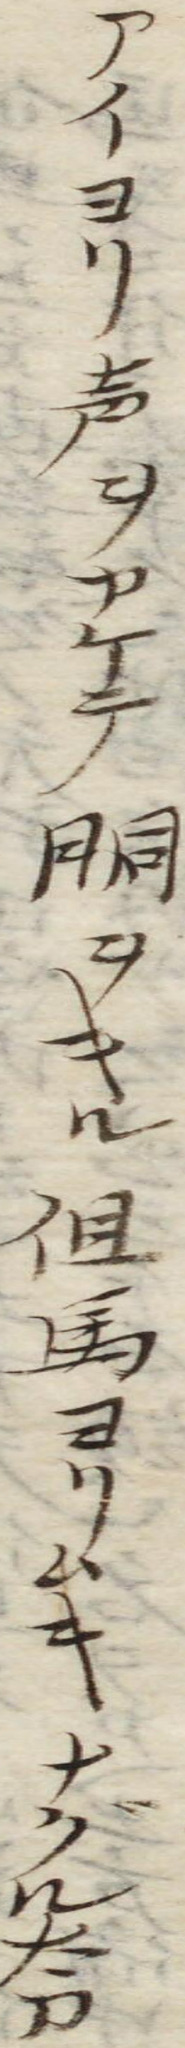アイヨリ声ヲアケテ胴ヲキル但馬ヨリムキナグル太刀
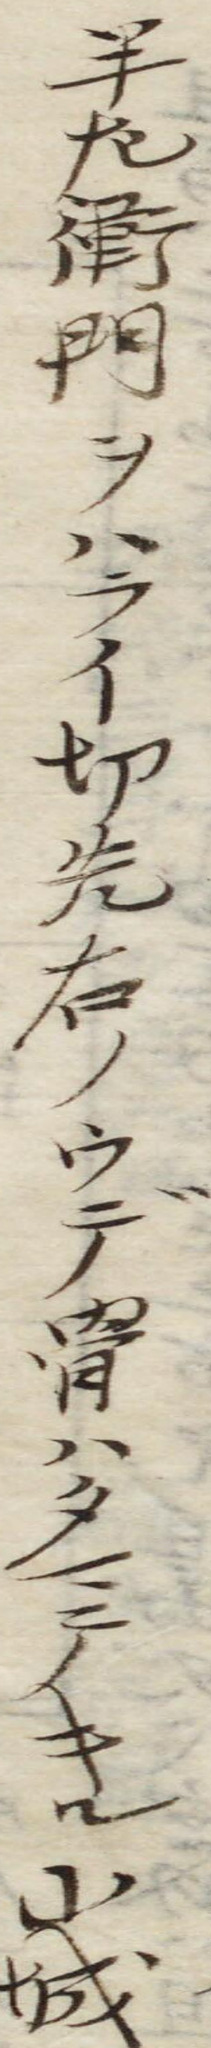半左衛門ヲハライ切先右ノウデ骨ハタテテキル山城
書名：聞見雑録
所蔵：Ishikawa Prefectural Library
